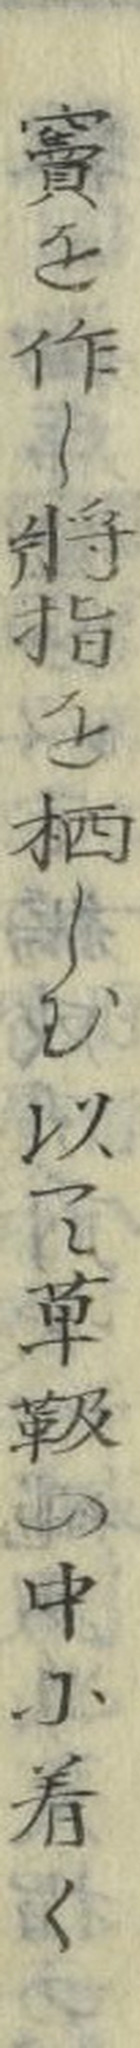竇を作し将指を栖しむ以て草靸の中に着く

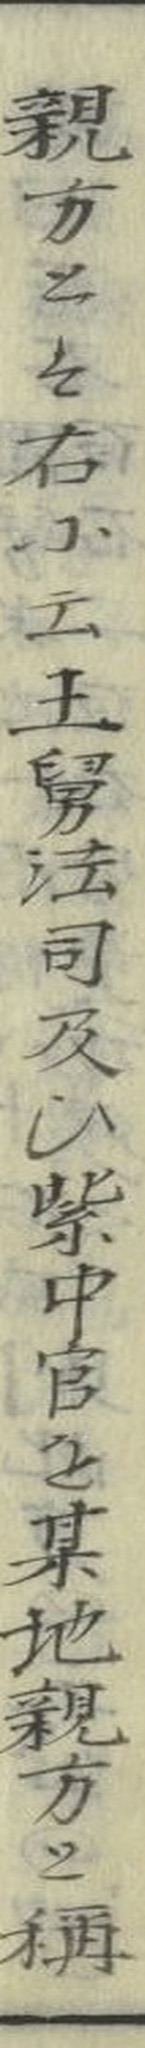親方とは右に云王舅法司及ひ紫中官を某地親方と称
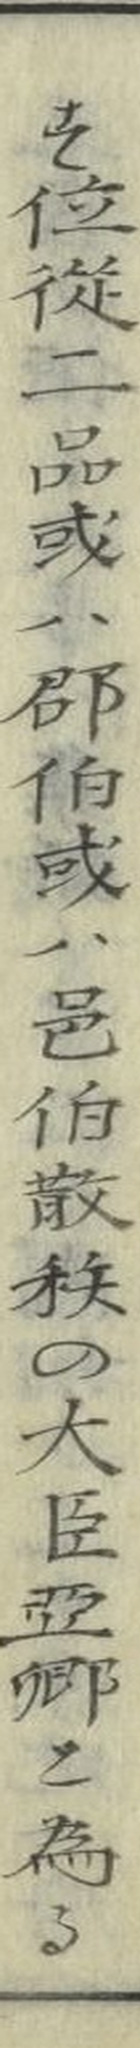す位従二品或は郡伯或は邑伯散秩の大臣亞卿と為る
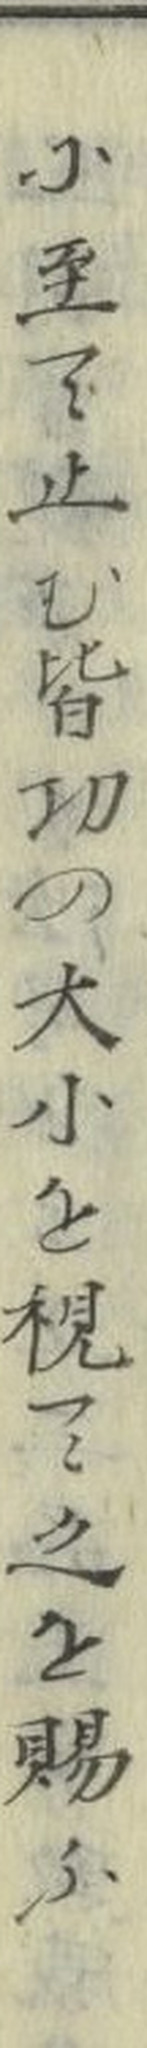に至て止む皆功の大小を視て之を賜ふ
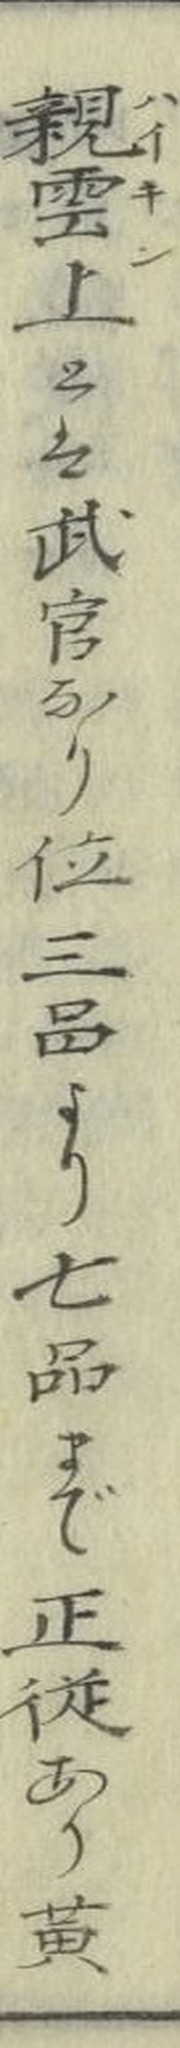親雲上とは武官なり位三品より七品まで正従あり黄
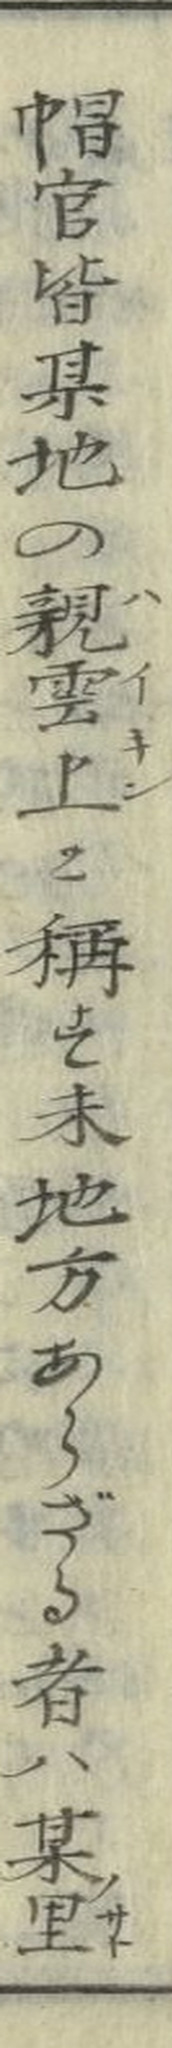帽官皆某地の親雲上と称す未地方あらざる者は某里
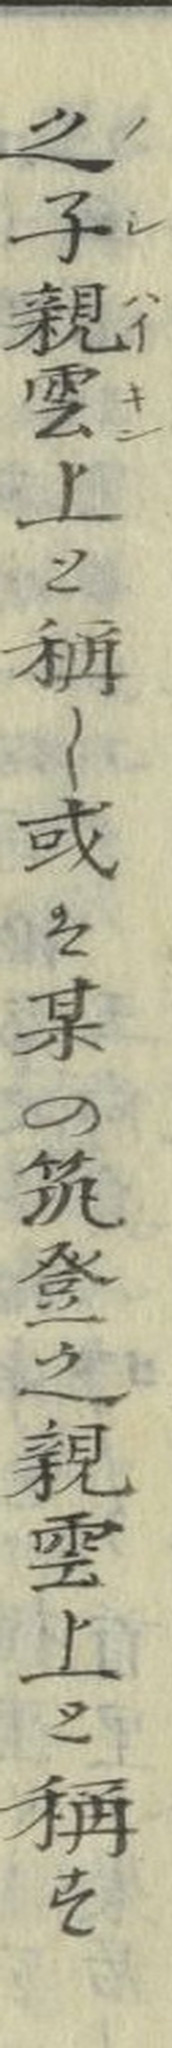之子親雲上と称し或は某の筑登之親雲上と称す
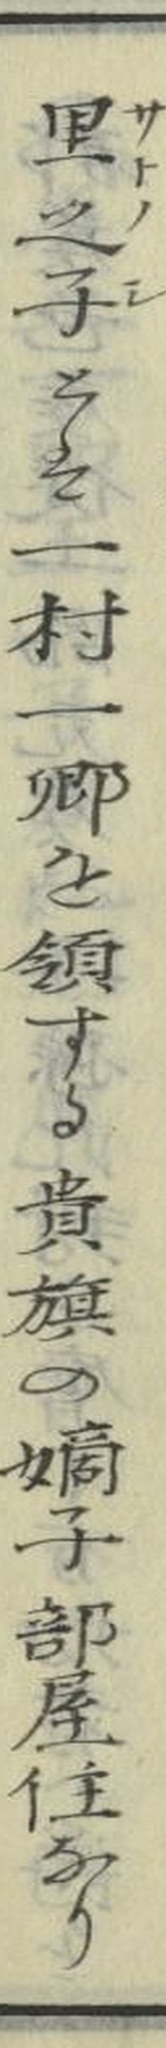里之子とは一村一卿を領する貴旗の嫡子部屋住なり
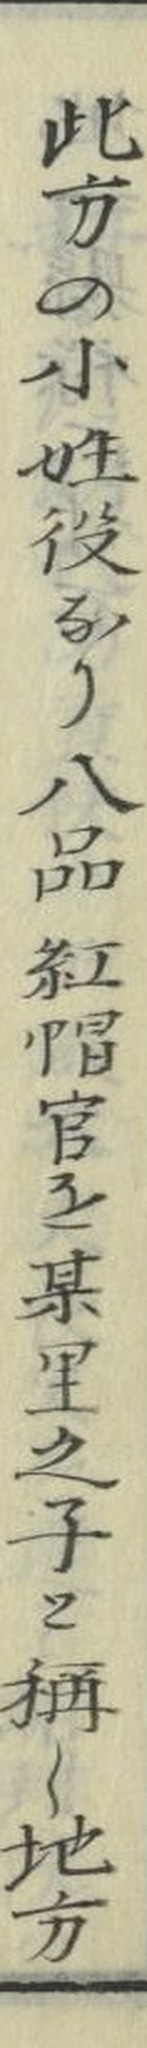此方の小姓役なり八品紅帽官を某里之子と称し地方
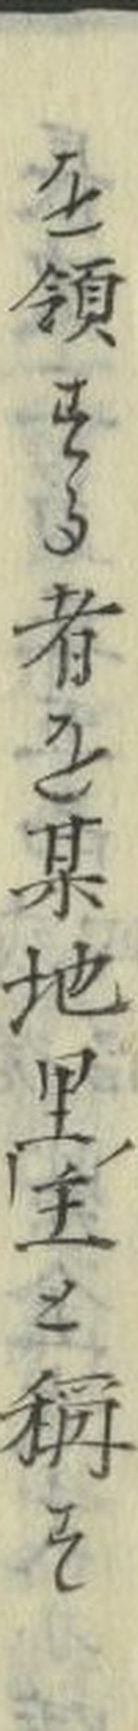を領する者を某地里-主と称す
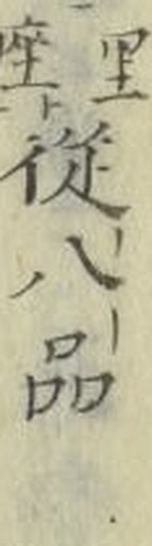従九品
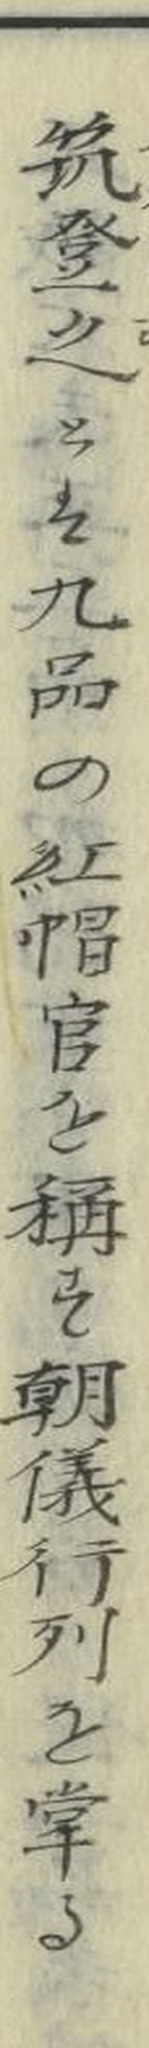筑登之とは九品の紅帽官を称す朝儀行列を掌る
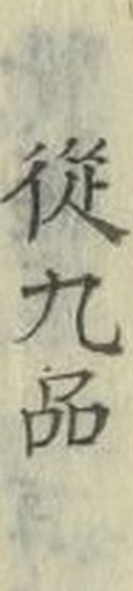従九品
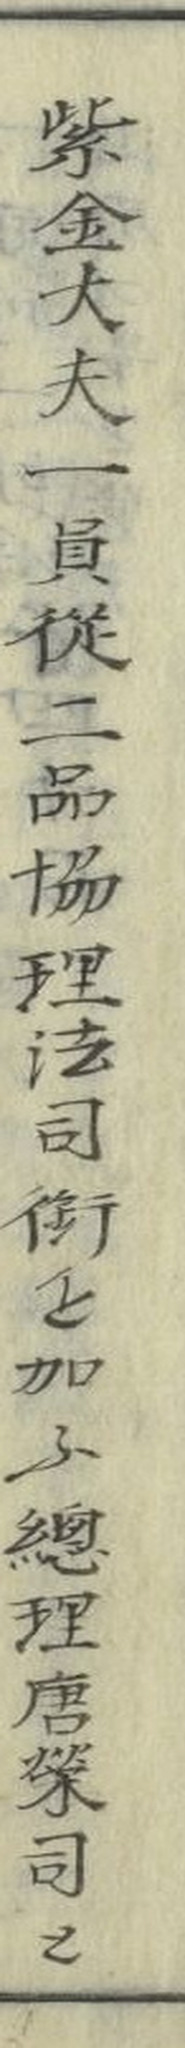紫金大夫一員従二品協理法司銜を加ふ総理唐栄司と
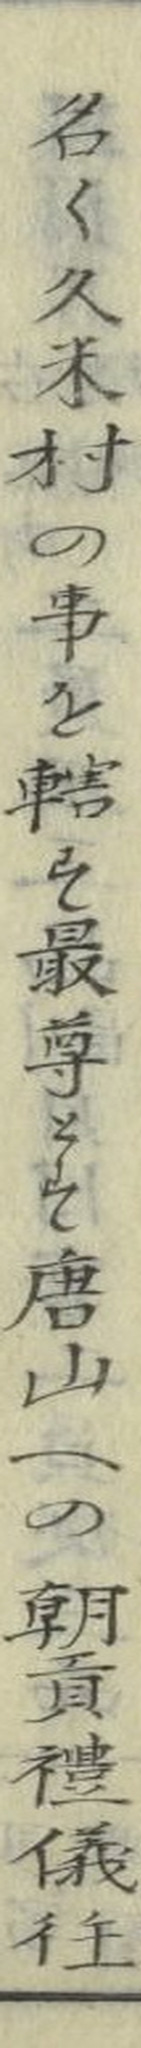名く久米村の事を轄す最尊とす唐山への朝貢礼儀往
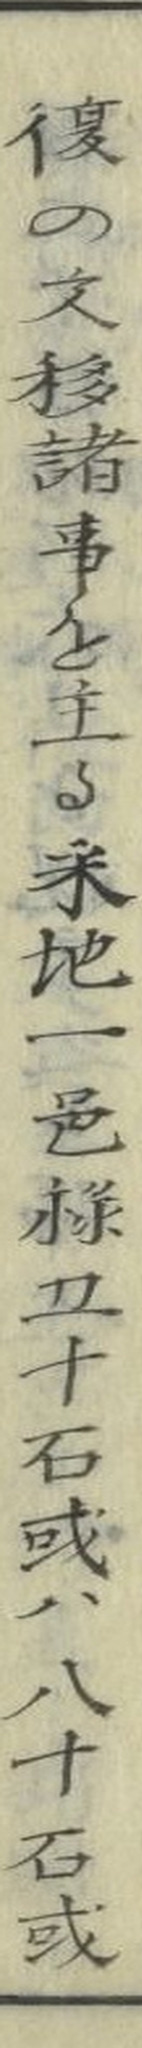復の文移諸事を主る采地一邑禄五十石或は八十石或
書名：琉球沿革志 上
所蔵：University of the Ryukyus Library
